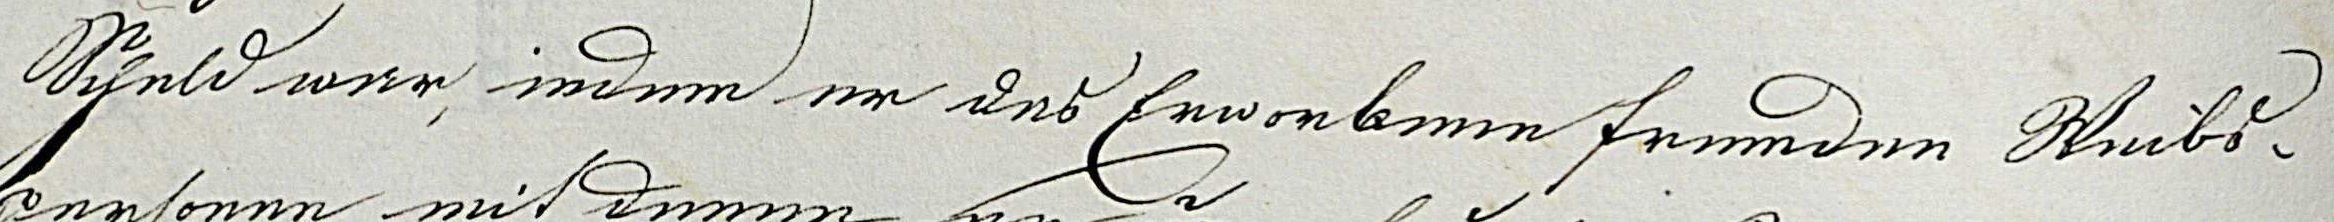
Schuld war, indem er des Erworbene fremden Weibs¬
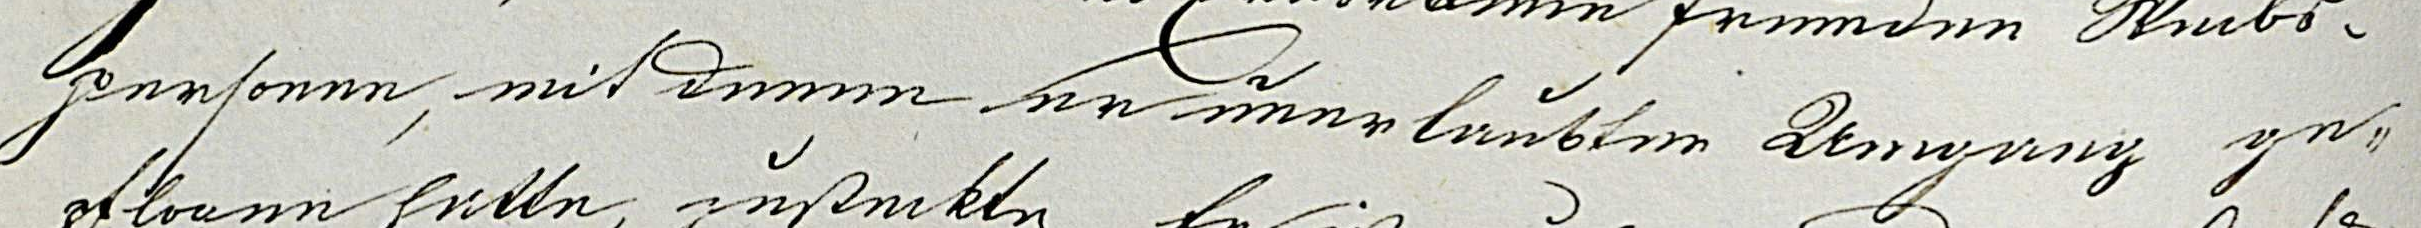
personen, mit denen er unerlaubter Umgang ge¬
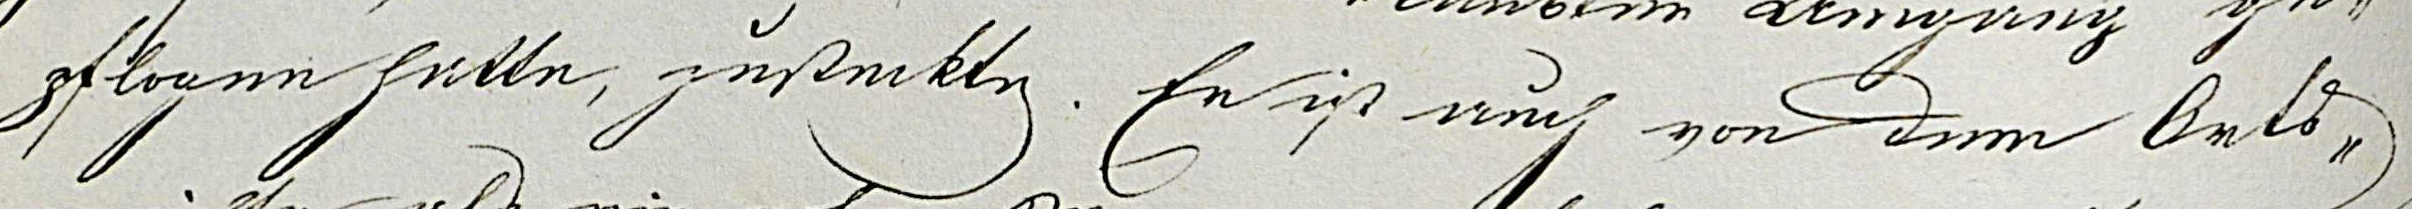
pflogen hatte, zusteckte. Er ist auch von dem Orts¬
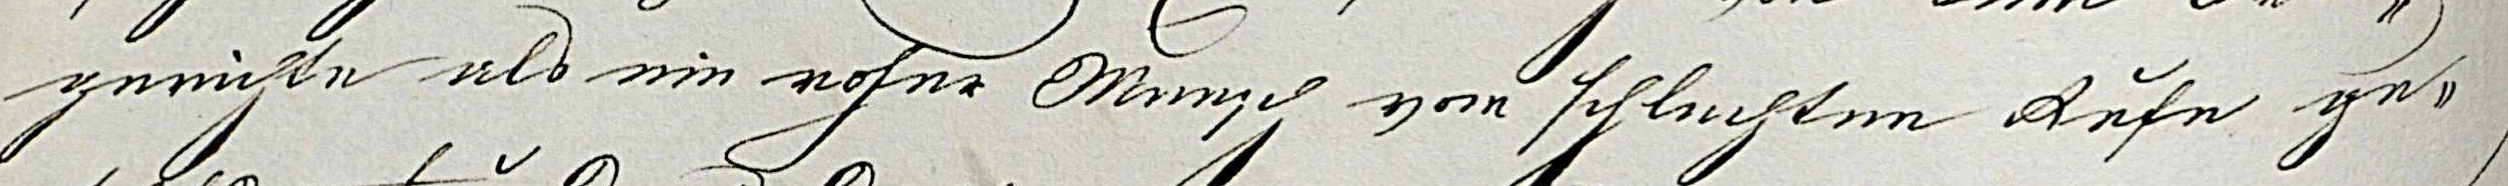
gerichte als ein roher Mensch von schlechten Rufe ge¬
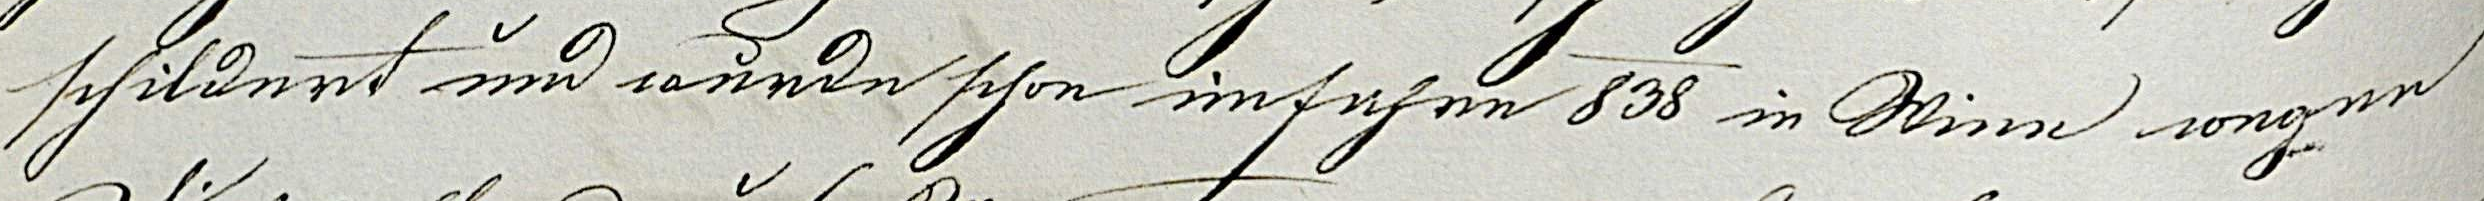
schildert und wurde schon im Jahre 1838 in Wien wegen
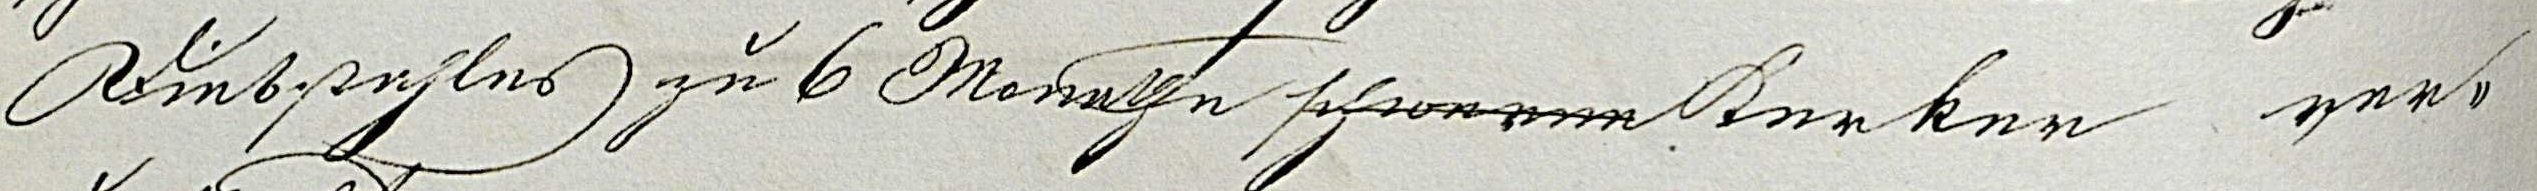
Diebstahles zu 6 Monathe schweren Kerker ver¬
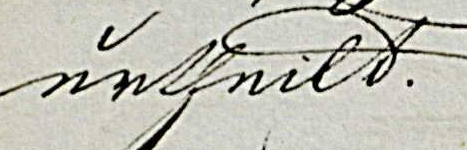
urtheilt.
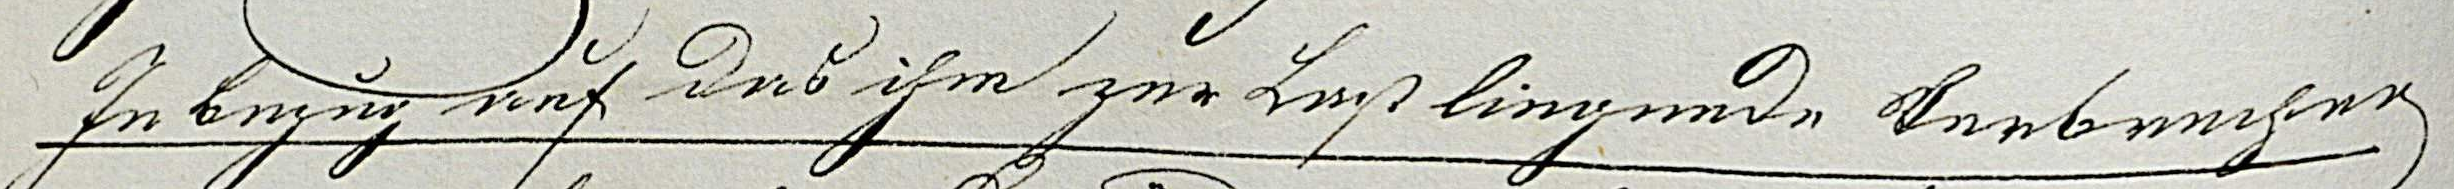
In Bezug auf das ihm zur Last liegende Verbrechen
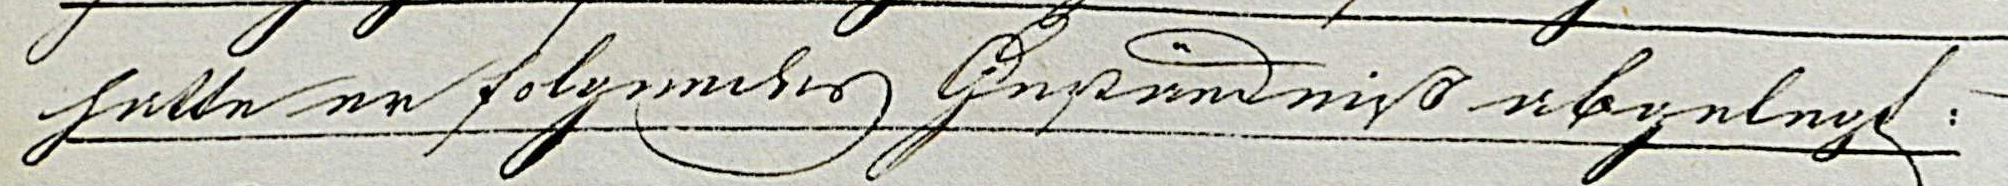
hatte er folgendes Geständniß abgelegt:
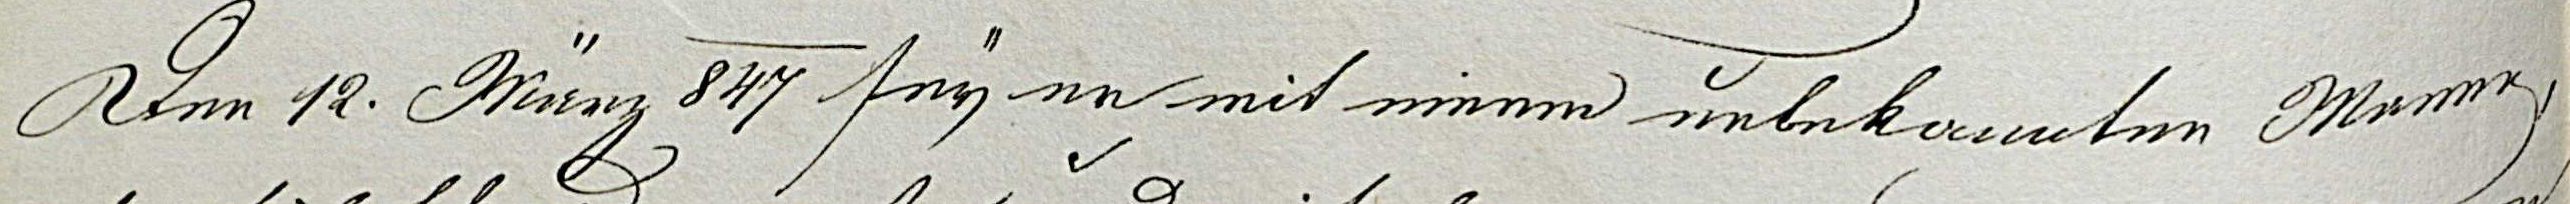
Am 12. März 1847 sey er mit einem unbekannten Manne
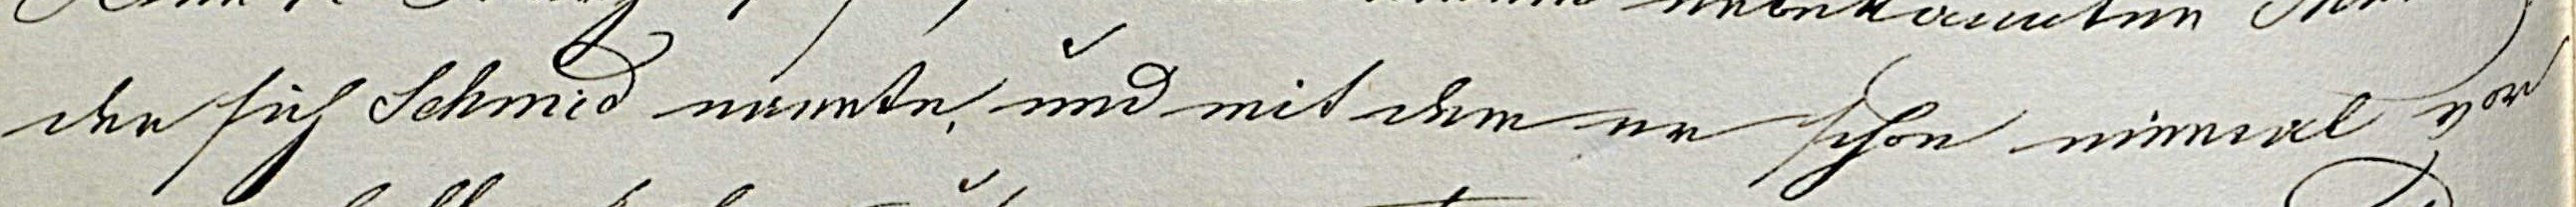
der sich Schmid nannte, und mit dem er schon einmal vor
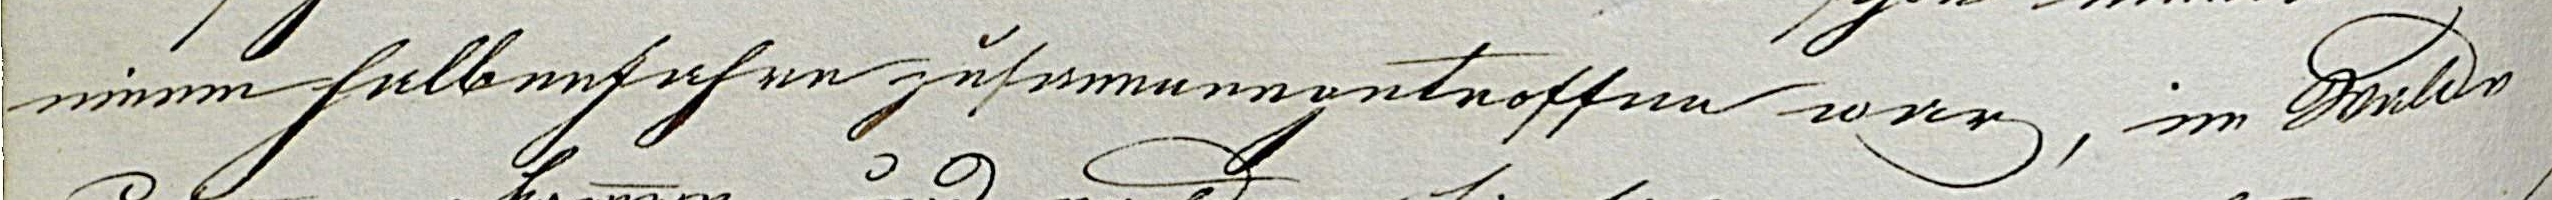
einem halben Jahre zusammengetroffen war, im Walde
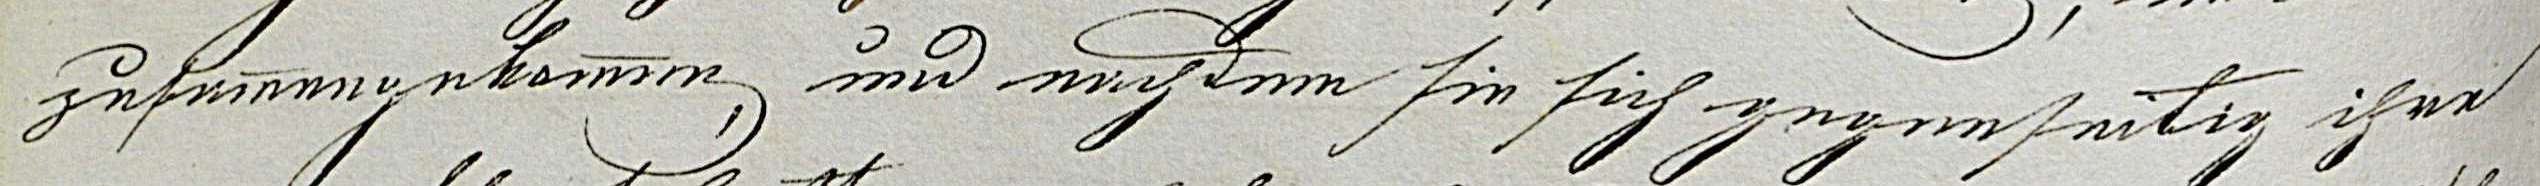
zusammengekommen, und nachdem sie sich gegenseitig ihre
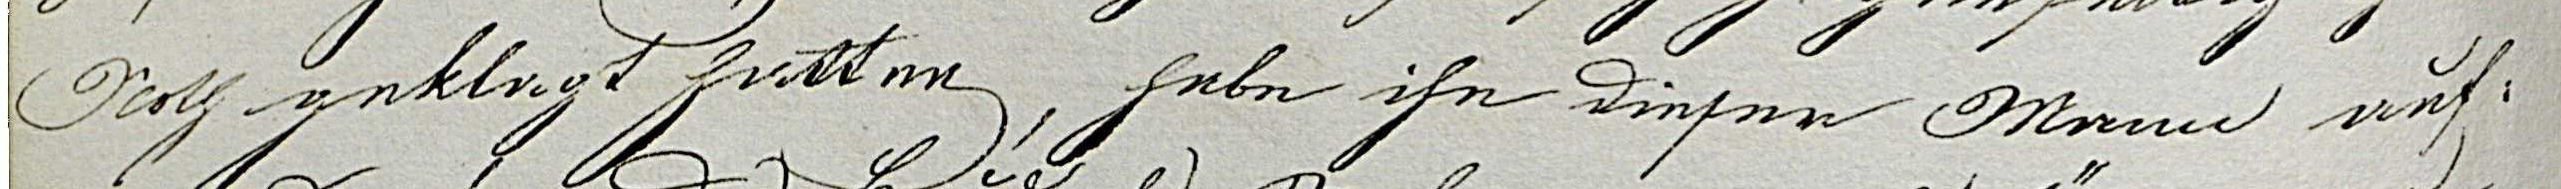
Noth geklagt hatten, habe ihn dieser Mann auf¬
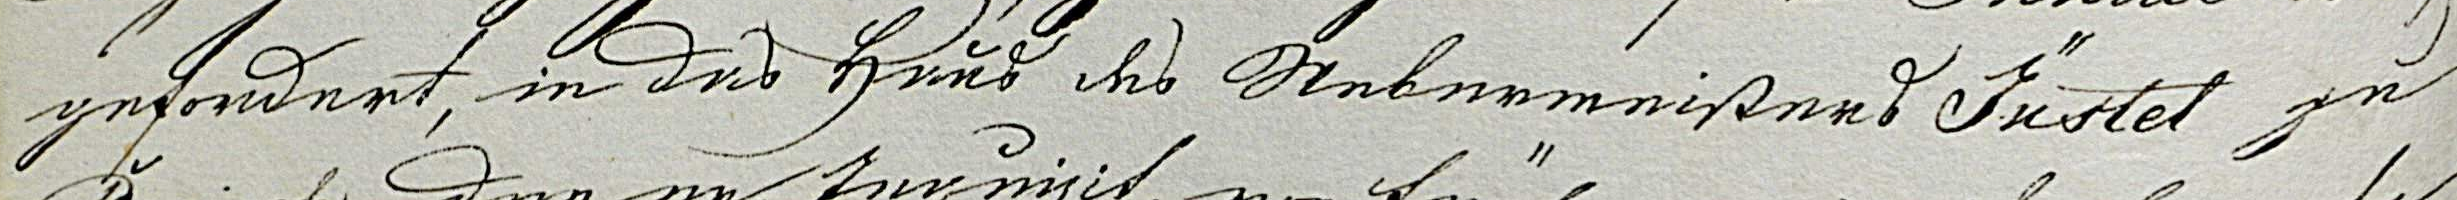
gefordert, in das Haus des Webermeisters Jüstel zu
